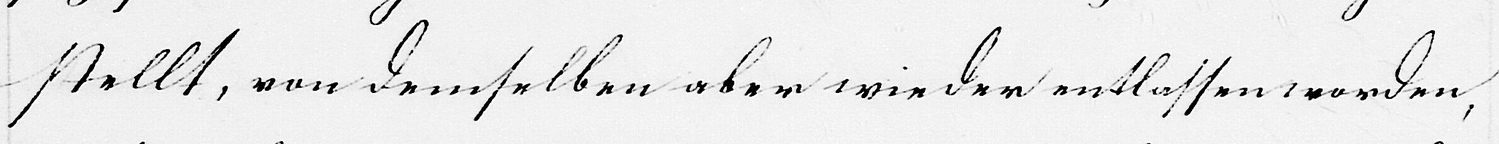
stellt, von demselben aber wieder entlassen worden,
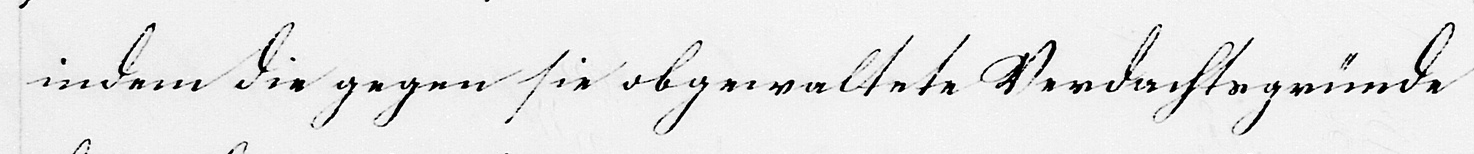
indem die gegen sie obgewaltete Verdachtsgründe
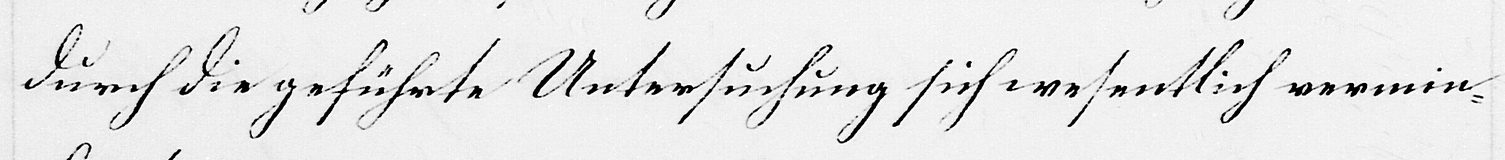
durch die geführte Untersuchung sich wesentlich vermin¬
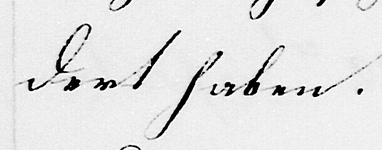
dert haben.
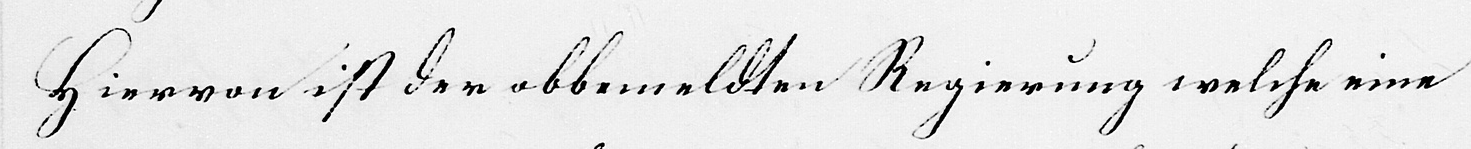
Hiervon ist der obbemeldten Regierung welche eine
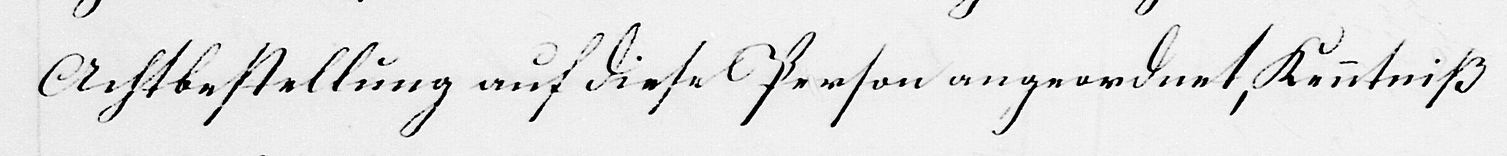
Achtbestellung auf diese Person angeordnet, Kenntniß
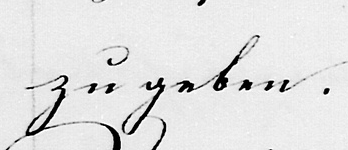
zu geben.
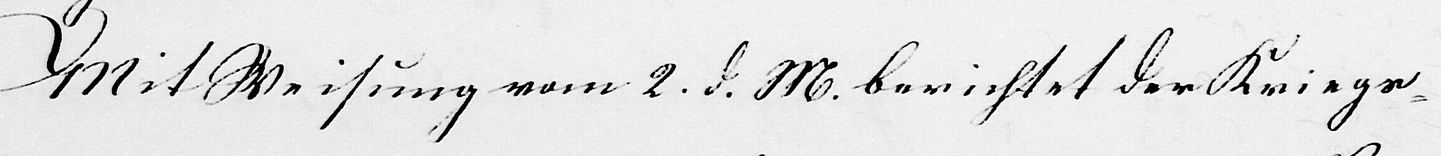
Mit Weisung vom 2. d. M. berichtet der Kriegs¬
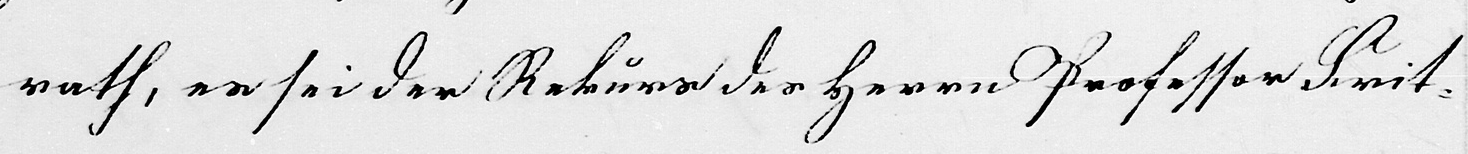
rath, es sei der Rekurs des Herrn Professor Frit¬
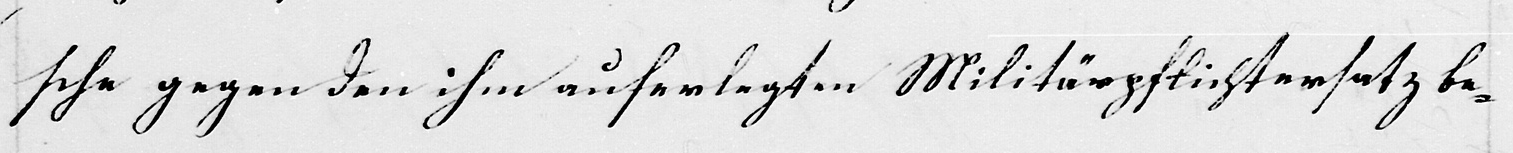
sche gegen den ihm auferlegten Militärpflichtersatz be-
